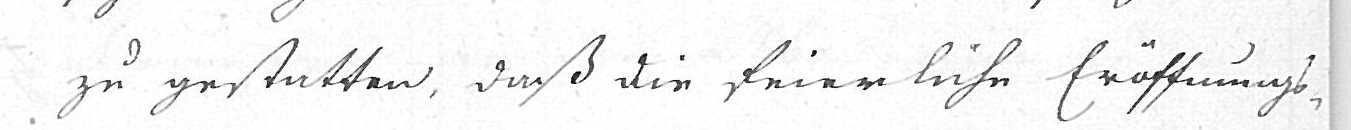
zu gestatten, daß die feierliche Eröffnungs-
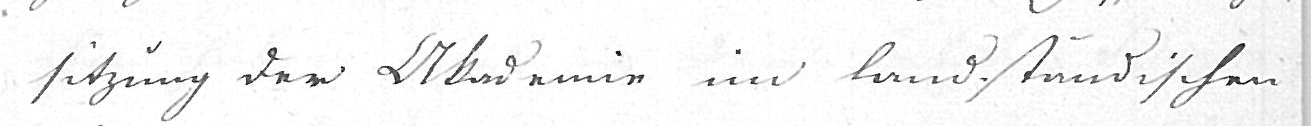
sitzung der Akademie im landständischen
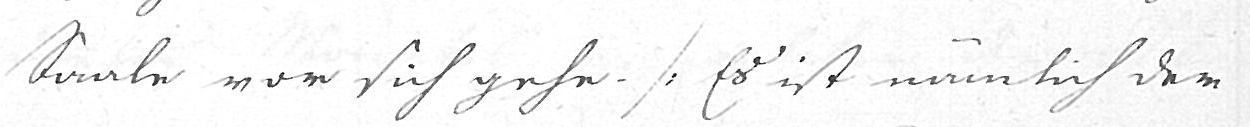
Saale vor sich gehe. (Es ist nämlich der
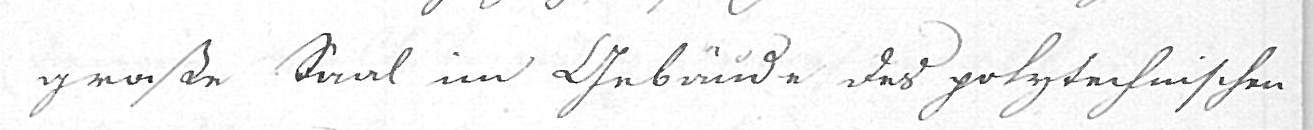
große Saal im Gebäude des polytechnischen
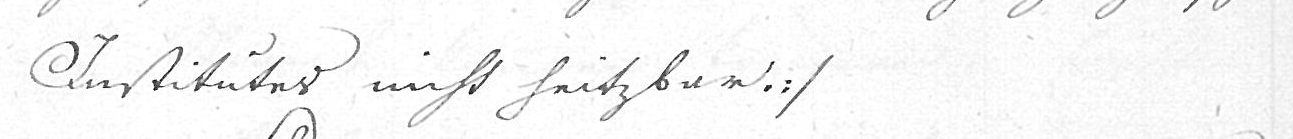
Institutes nicht heitzbar.)
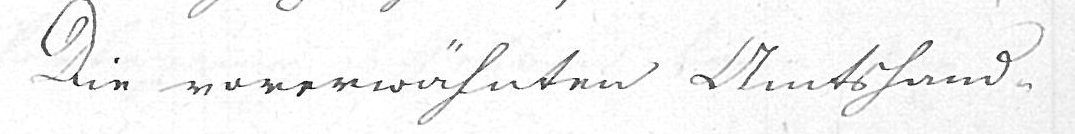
Die vorerwähnten Amtshand-
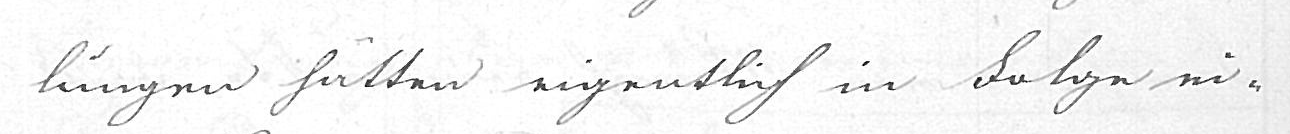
lungen hätten eigentlich in Folge ei-
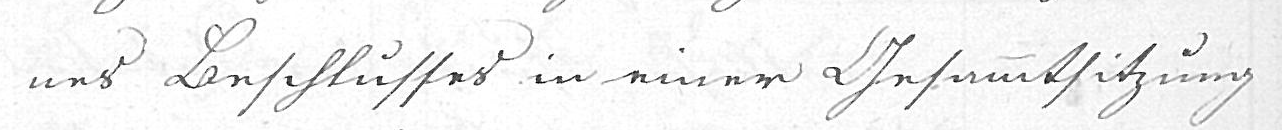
nes Beschlusses in einer Gesammtsitzung
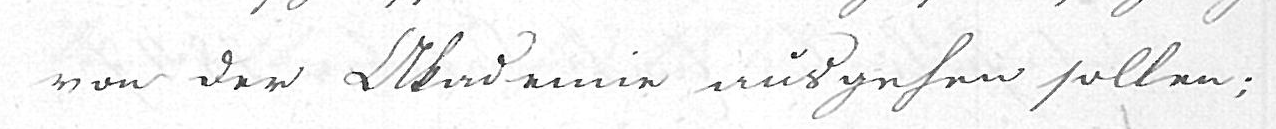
von der Akademie ausgehen sollen;
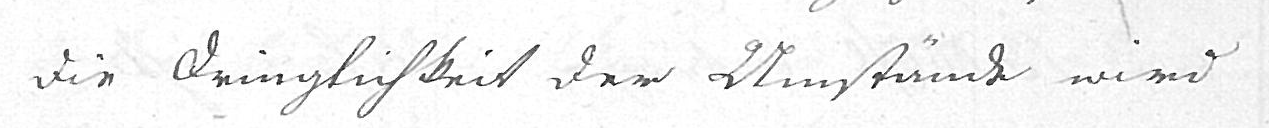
die Dringlichkeit der Umstände wird
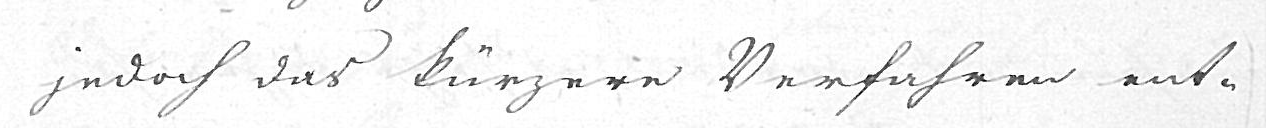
jedoch das kürzere Verfahren ent-
